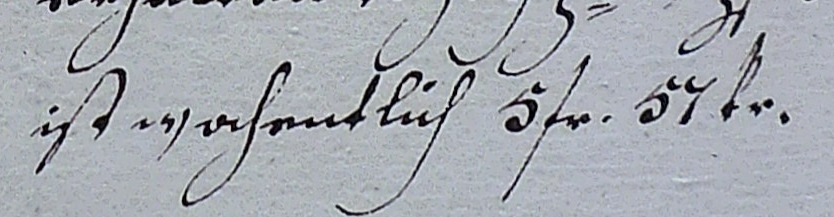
ist wochentlich 5fr. 57kr.
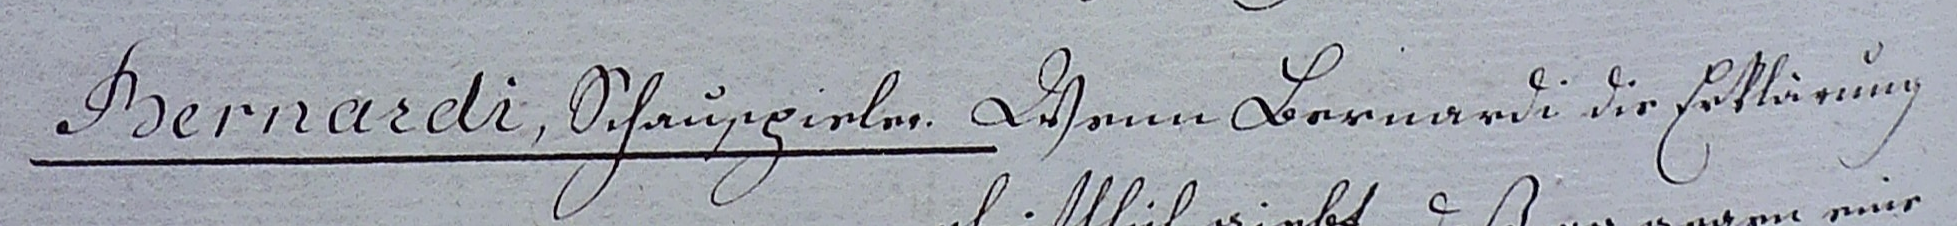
Bernardi, Schauspieler. Wenn Bernardi die Erklärung
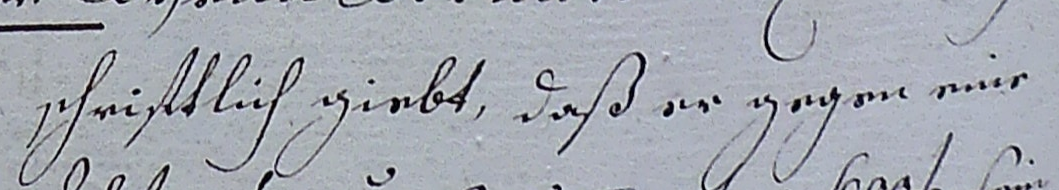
schriftlich giebt, daß er gegen eine
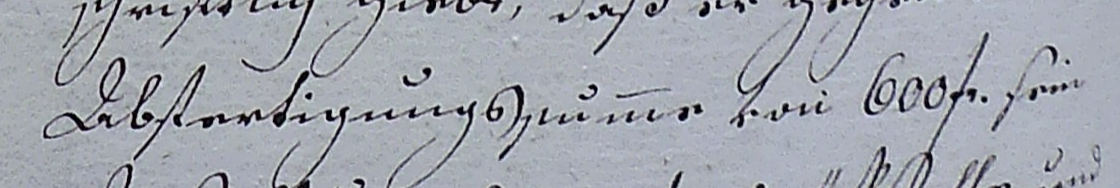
Abfertigungssum̅e von 600fr. sein
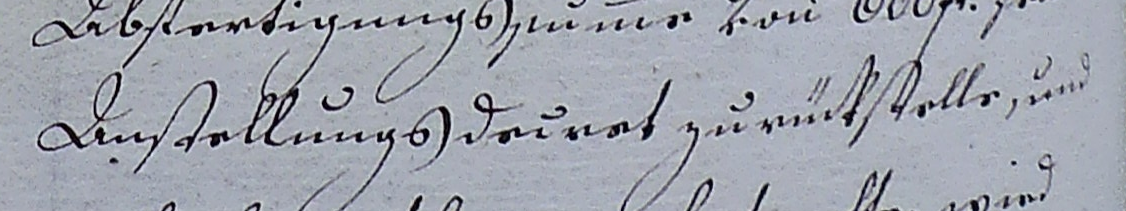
Anstellungsdecret zurückstelle, und
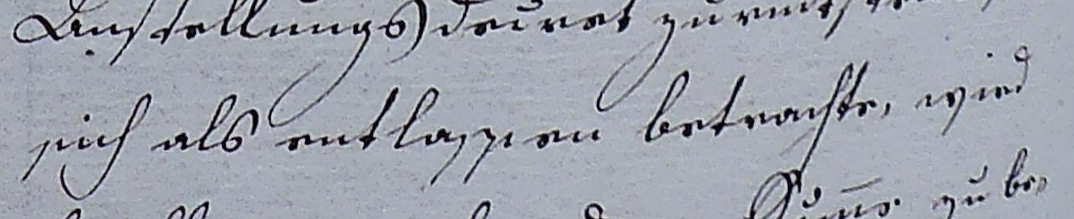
sich als entlassen betrachte, wird
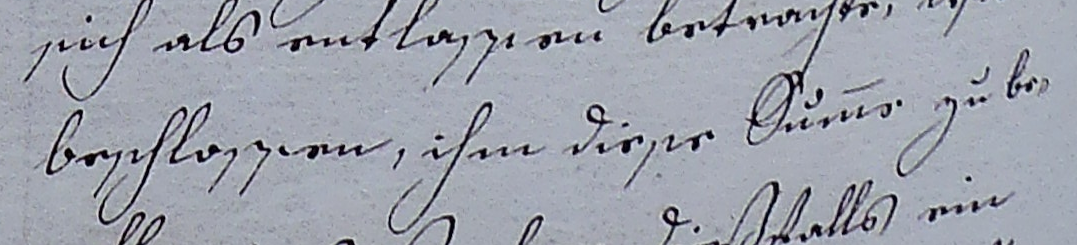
beschlossen, ihm diese Sum̅e zu be¬
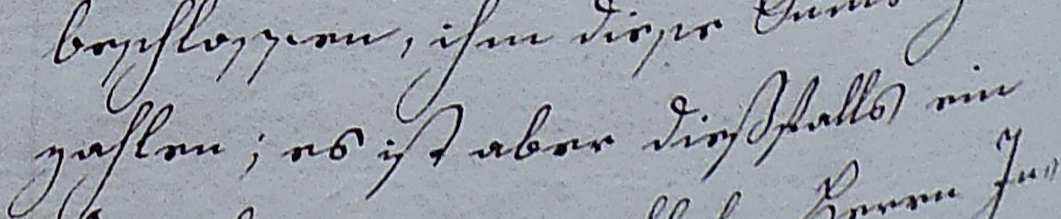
zahlen; es ist aber dießfalls ein
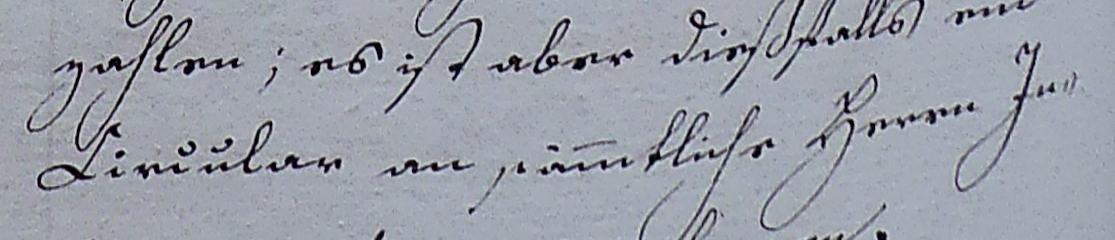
Circular an säm̅tliche Herrn In
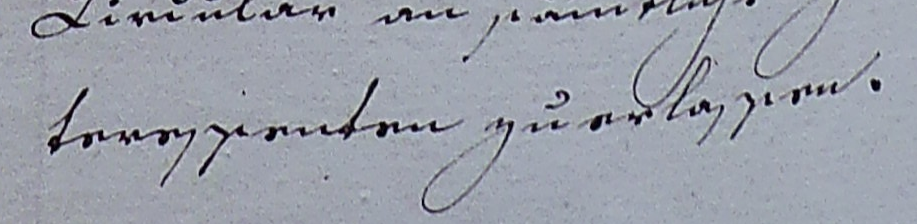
teressenten zuerlassen.
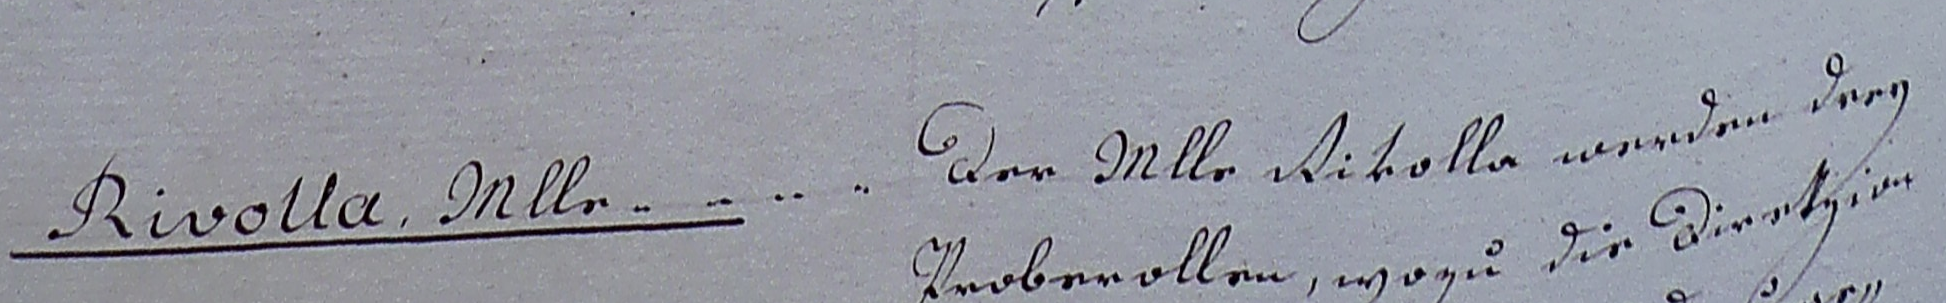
Rivolla, Mlle .. .. .. .. Der Mlle Rivolla werden drey
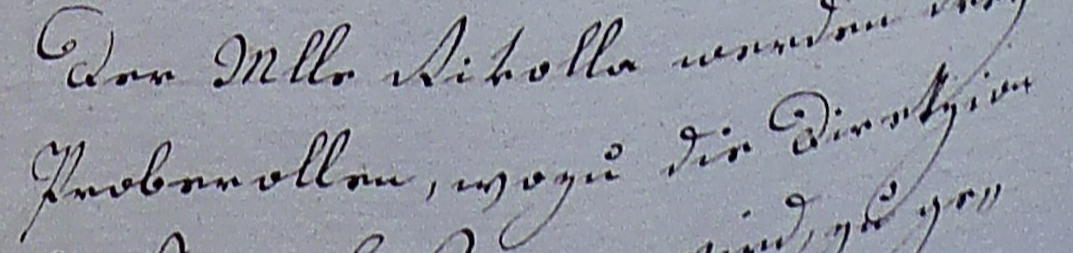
Proberollen, wozu die Direkzion
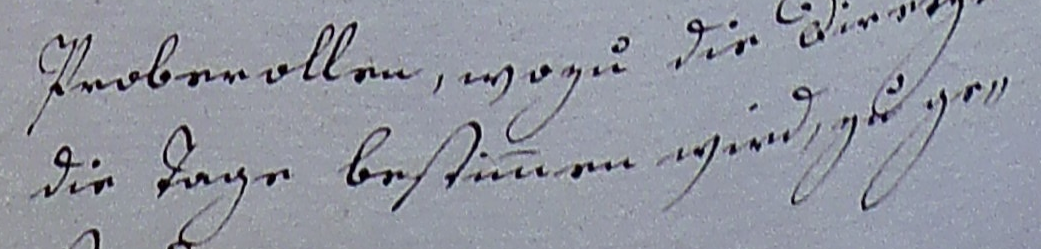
die Tage bestim̅en wird, zu ge¬
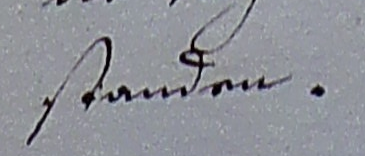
standen.
